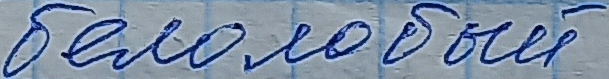белолобый
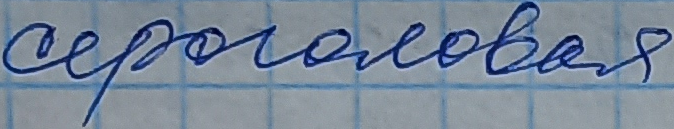сероголовая
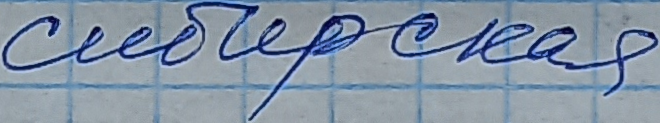сибирская
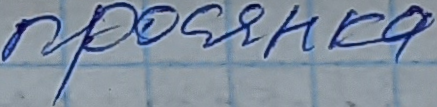просянка
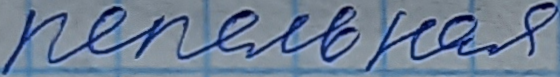пепельная
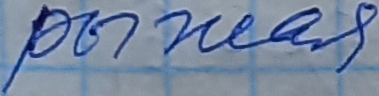рыжая
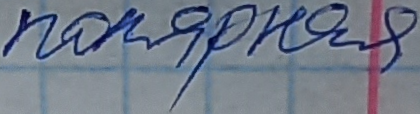полярная
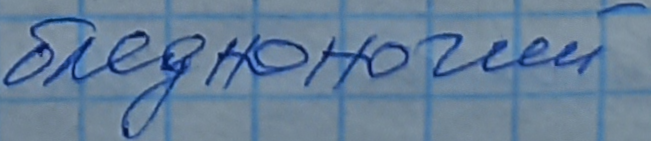бледноногий
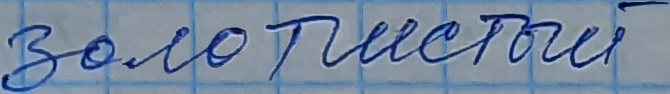золотистый
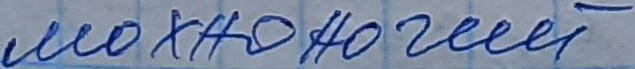мохноногий
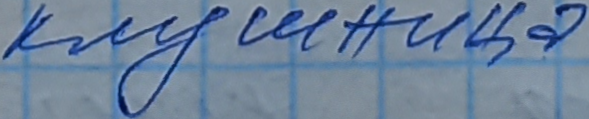клушница
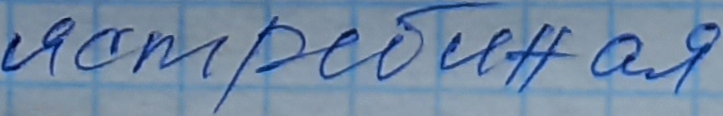ястребиная
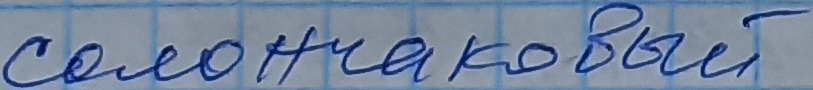солончаковый
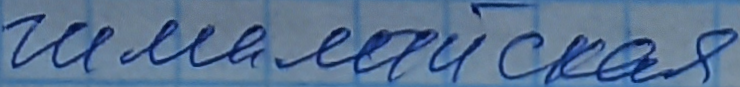гималайская
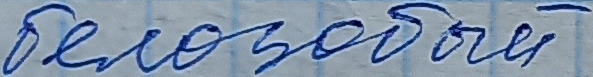белозобый
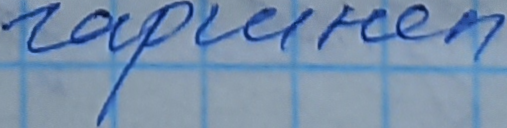гаршнеп
